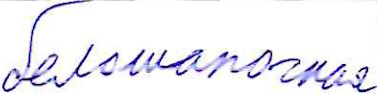белошапочная
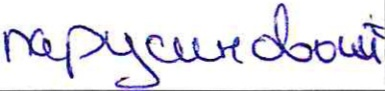парусиновый
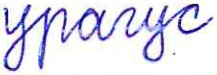урагус
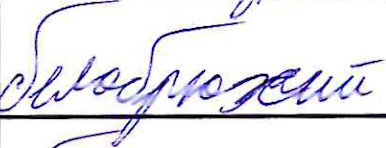белобрюхий
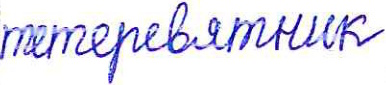тетеревятник
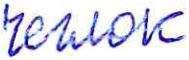чеглок
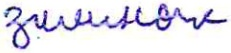зимняк
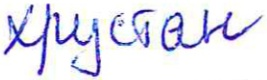хрустан
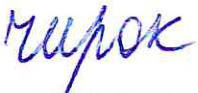чирок
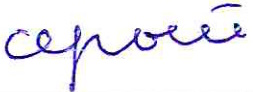серый
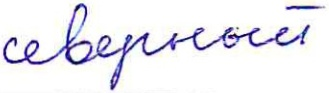северный
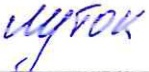луток
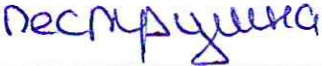пеструшка
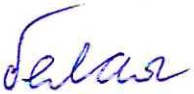белая
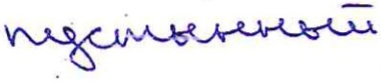пустынный
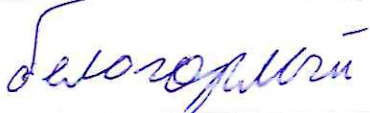белогорлый
